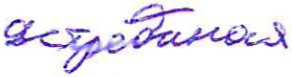ястребиная
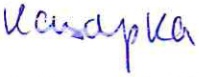казарка
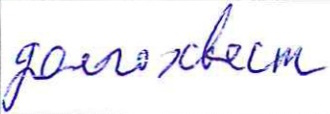долгохвост
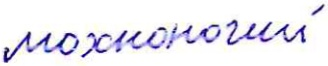мохноногий
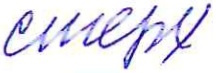стерх
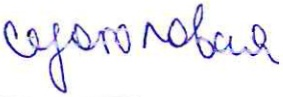седоголовая
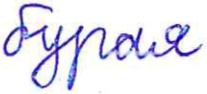бурая
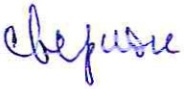сверчок
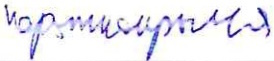корткорылся
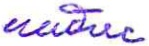чибис
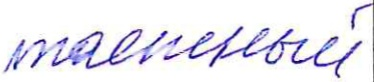таежный
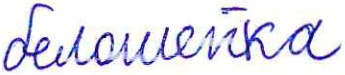белошейка
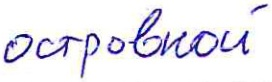островной
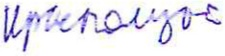красполцы
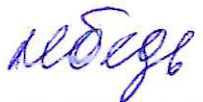лебедь
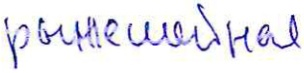рыжешейная
